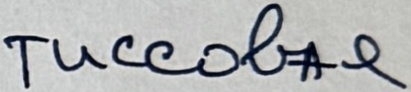тиссовая
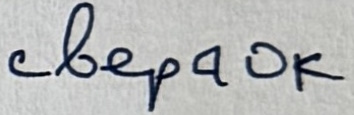сверчок
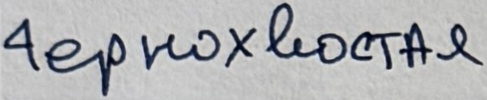чернохвостая
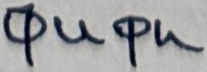фифи
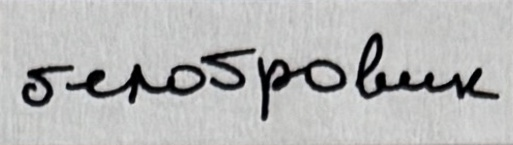белобровик
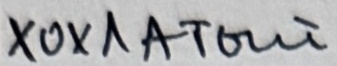хохлатый
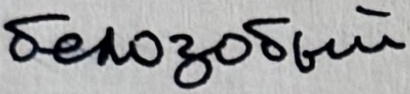белозобый
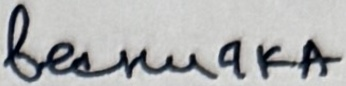весничка
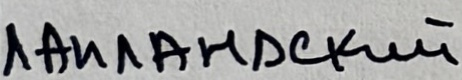лапландский
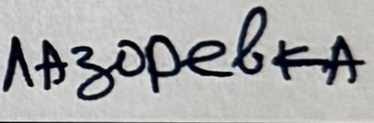лазоревка
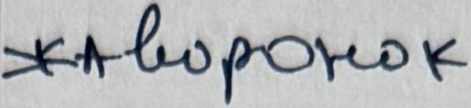жаворонок
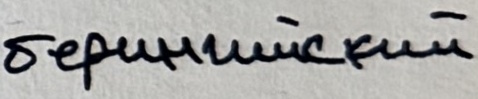берингийский
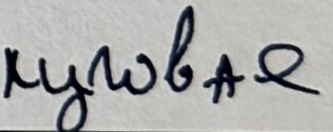луговая
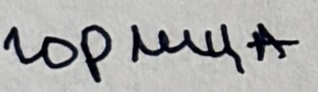горлица
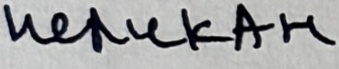пеликан
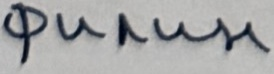филин
